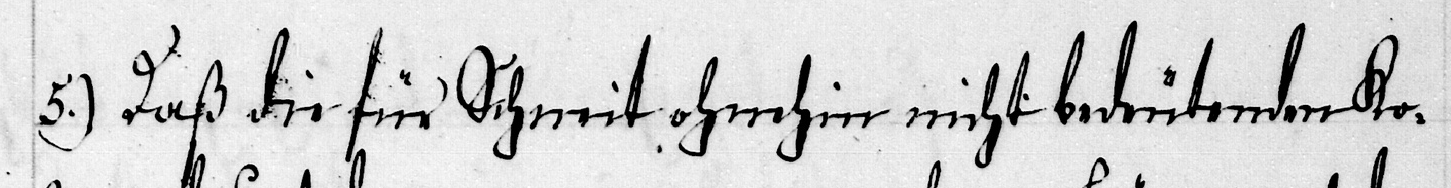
5.) Daß die für Schneit ohnehin nicht bedeutenden Ko¬
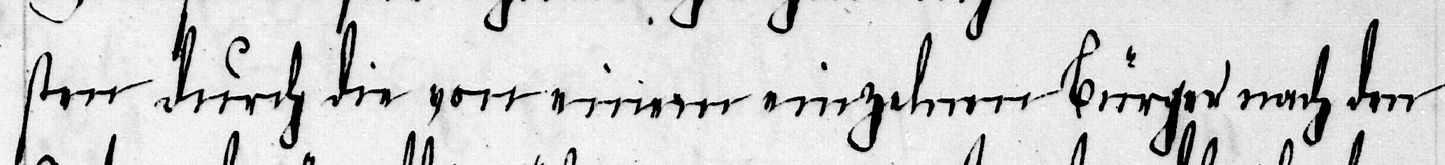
sten durch die von einem einzelnen Bürger nach den
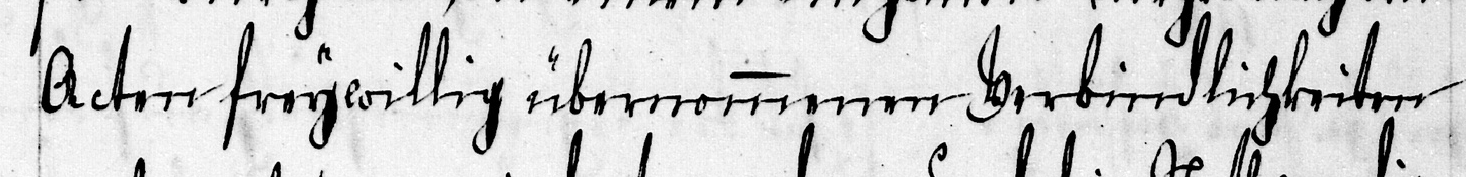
Acten freywillig übernommenen Verbindlichkeiten
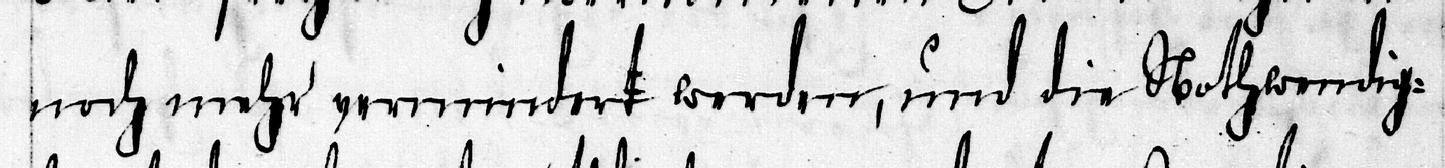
noch mehr vermindert werden, und die Nothwendig¬
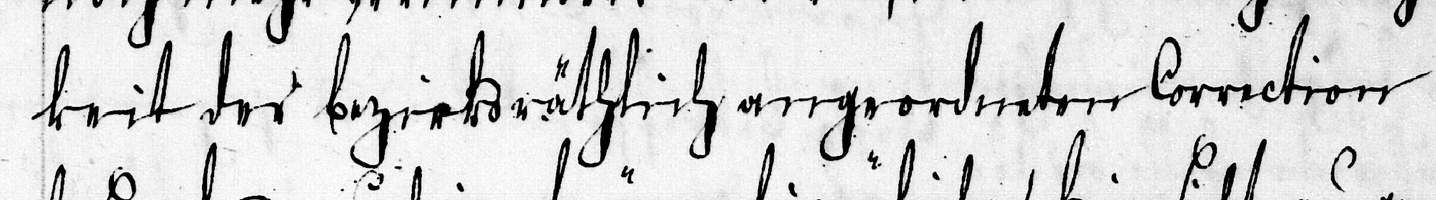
keit der bezirksräthlich angeordneten Correction
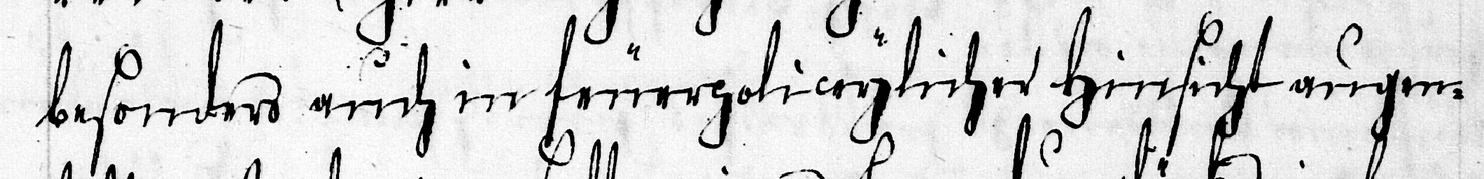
besonders auch in feuerpoliceylicher Hinsicht augen¬
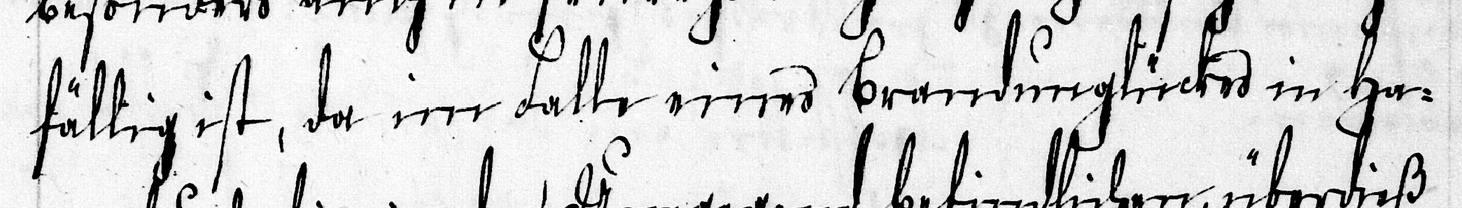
fällig ist, da im Falle eines Brandunglückes in Ha¬
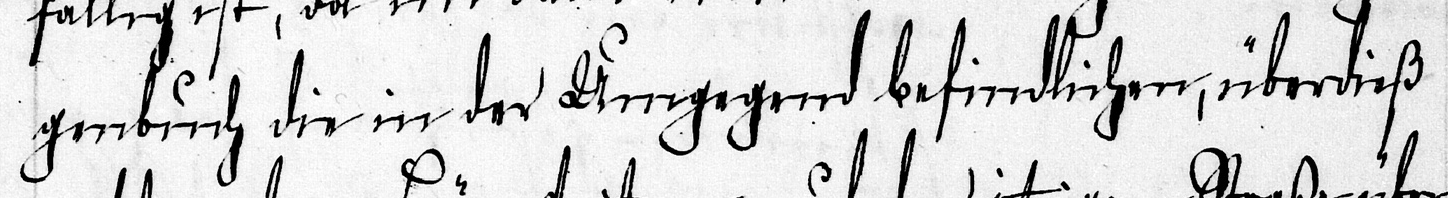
genbuch die in der Umgegend befindlichen, überdieß
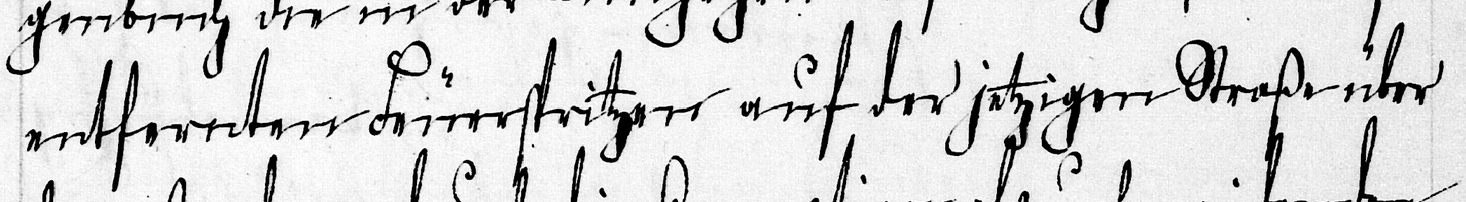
entfernten Feuerspritzer auf der jetzigen Straße über
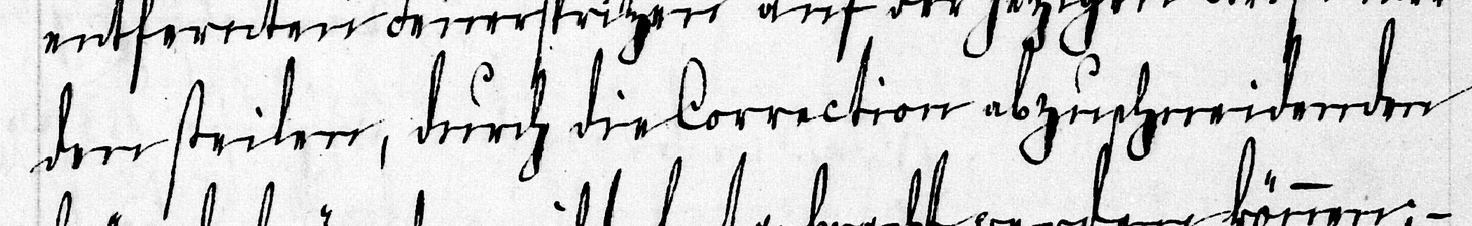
den steilen, durch die Correction abzuschneidenden
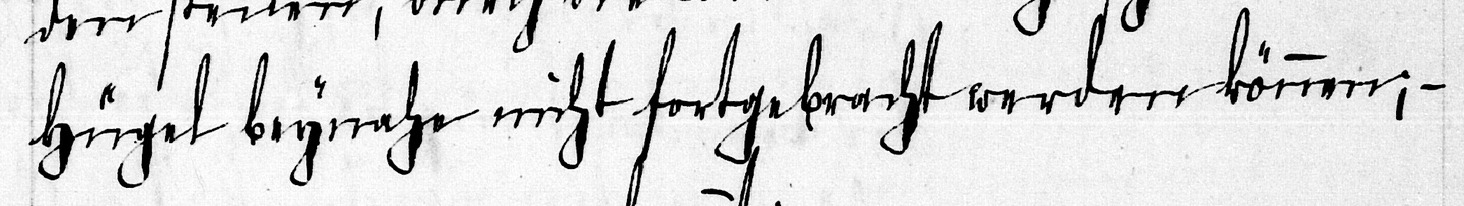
Hügel beynahe nicht fortgebracht werden können; –
